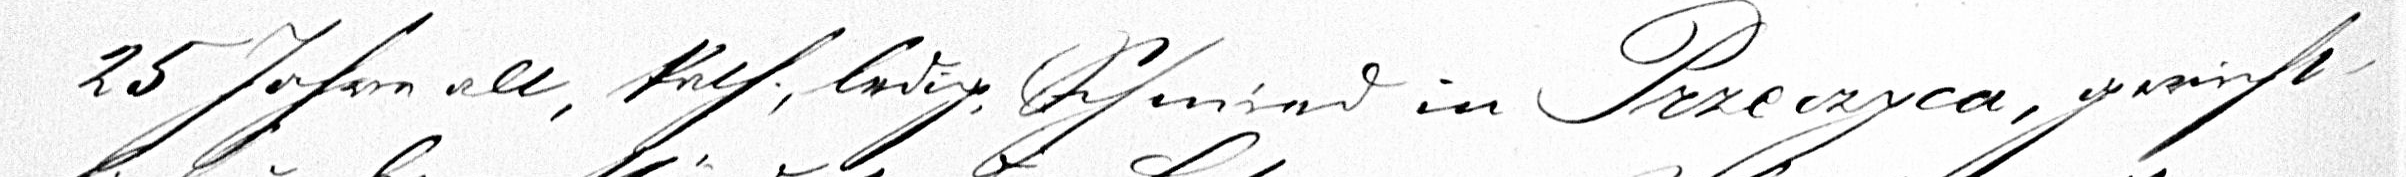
25 Jahre alt, kath., ledig, Schmied in Przeczyca, gericht¬
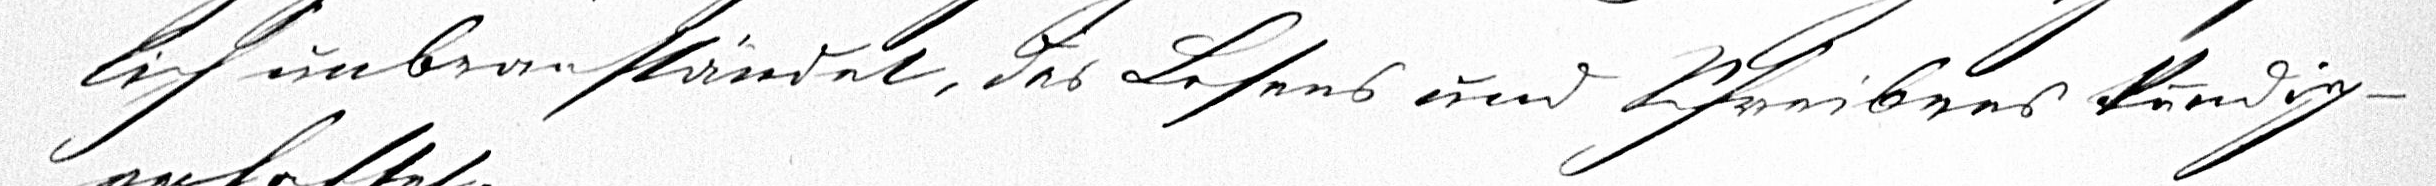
lich unbeanständet, des Lesens und Schreibens kundig¬
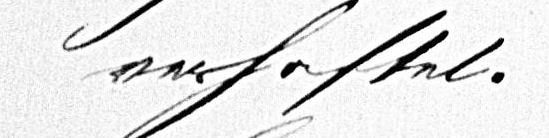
verhaftet.
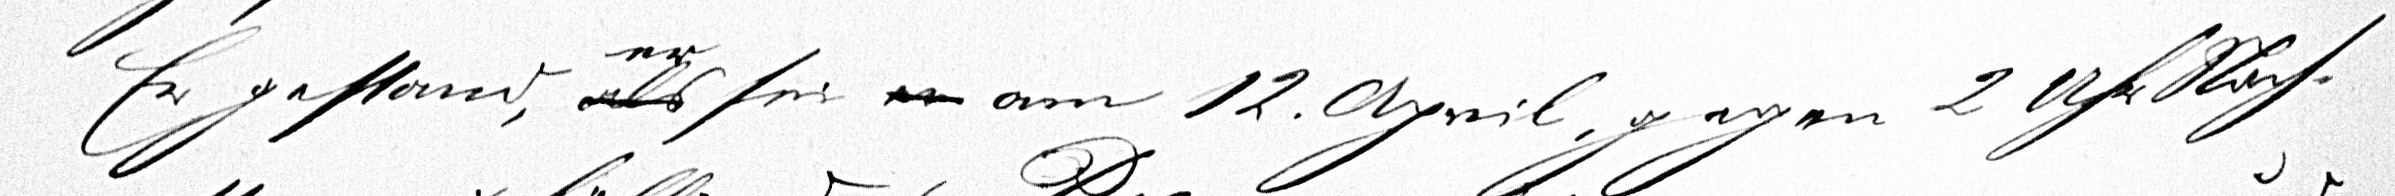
Er gestand, er sei am 12. April, gegen 2 Uhr Nach¬
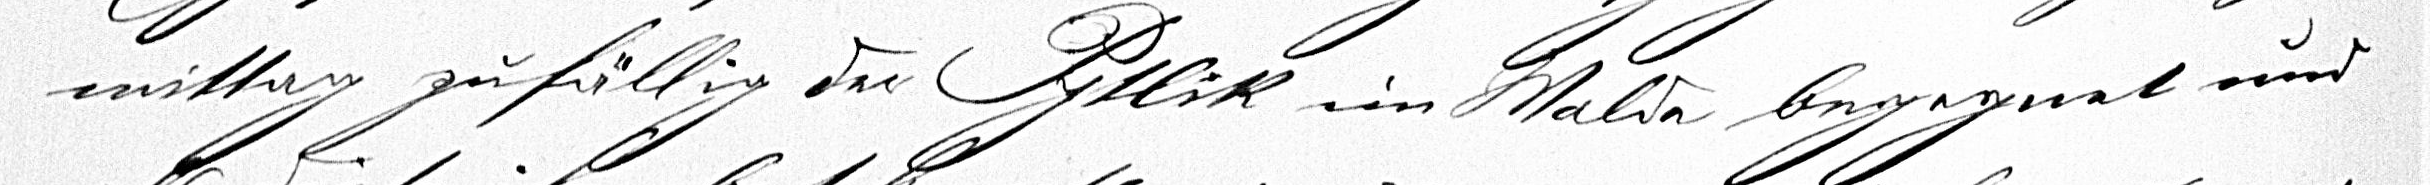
mittag zufällig der Pytlik im Walde begegnet und
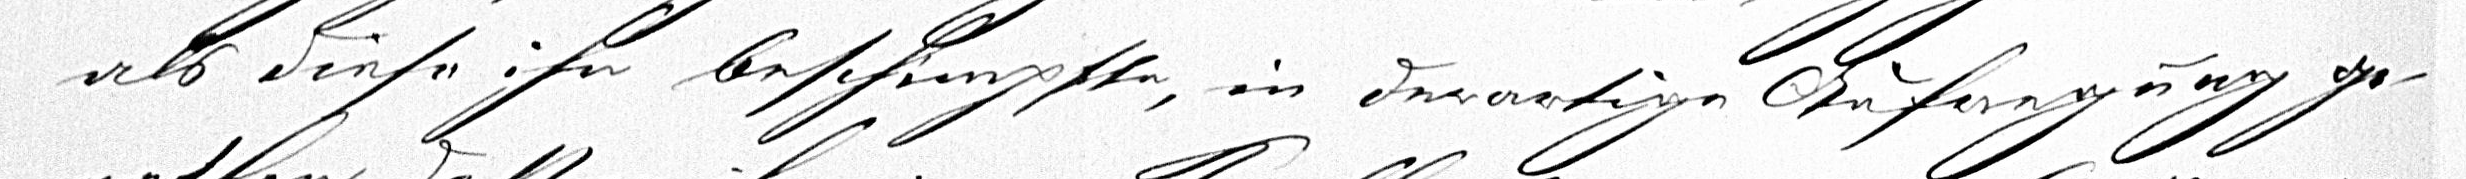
als diese ihn beschimpfte, in derartige Aufregung ge¬
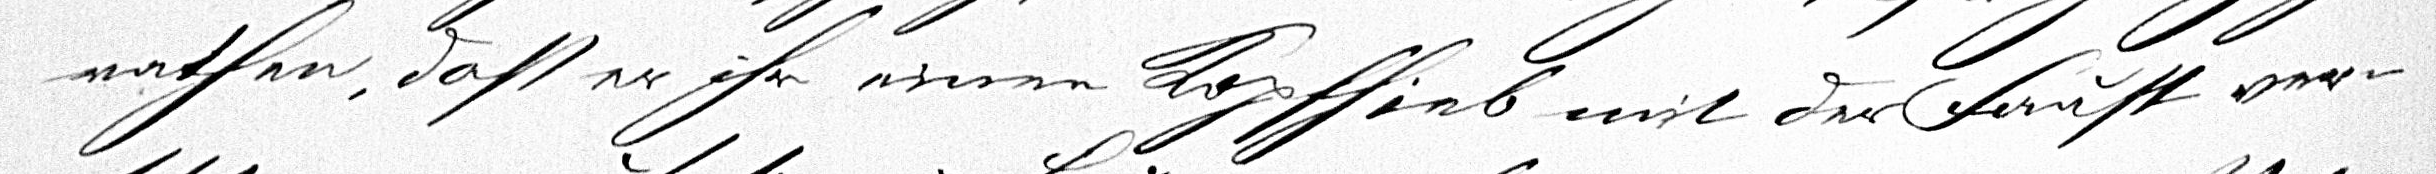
rathen, daß er ihr einen Kopfhieb mit der Faust ver¬
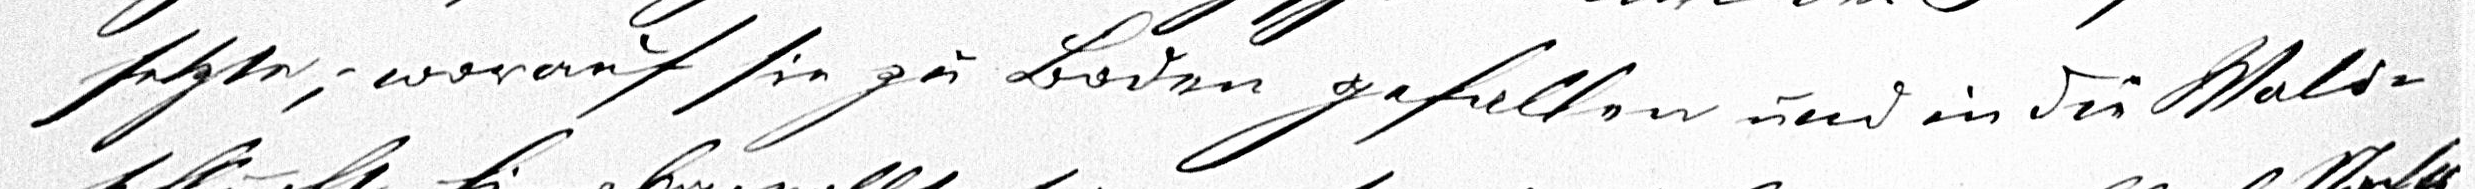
setzte; worauf sie zu Boden gefallen und in die Wald¬
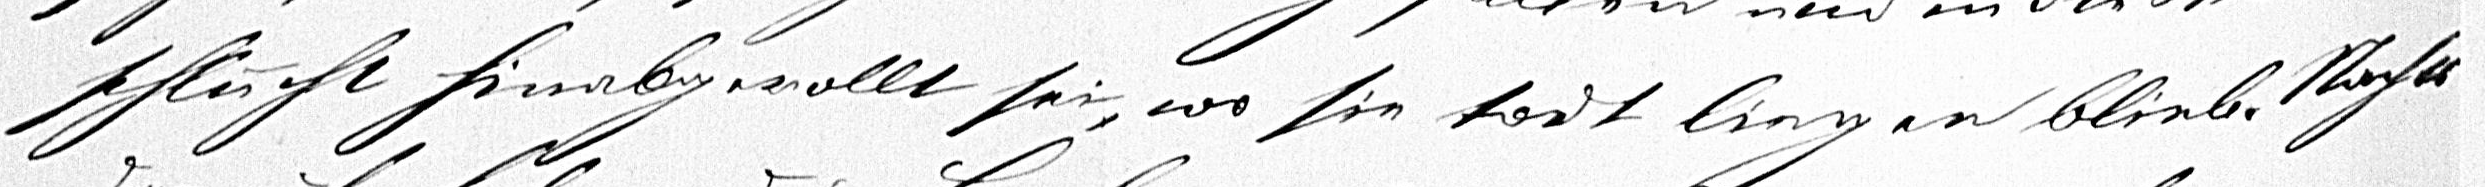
schlucht hinabgewollt sei, wo sie todt liegen blieb. Nachxx
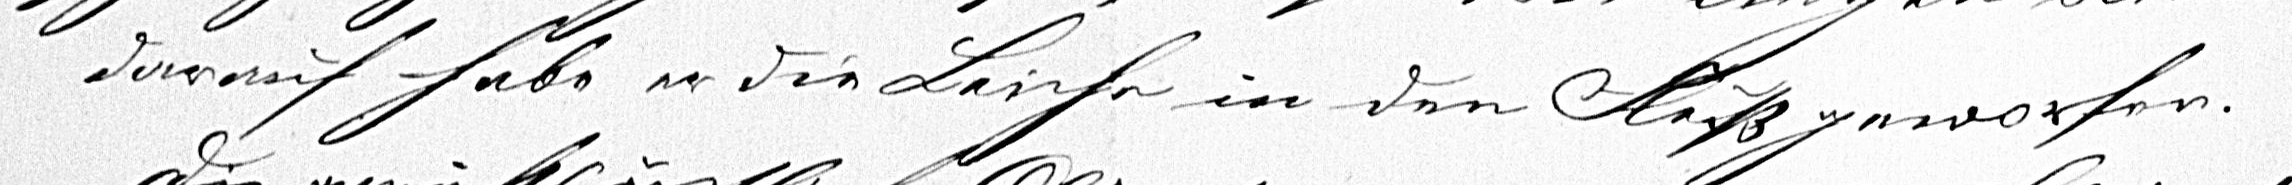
darauf habe er die Leiche in den xx geworfen.
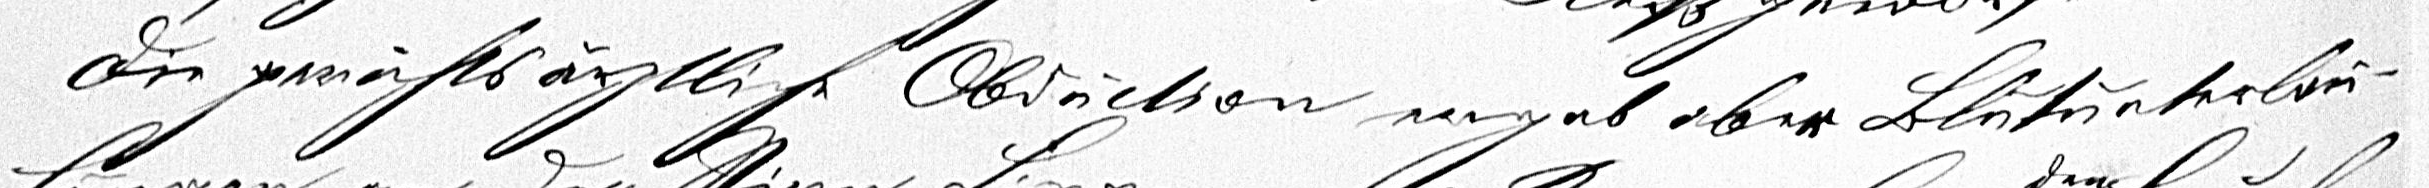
Die gerichtsärztliche Obduction ergab aber Blutunterlau¬
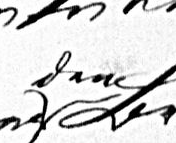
dem
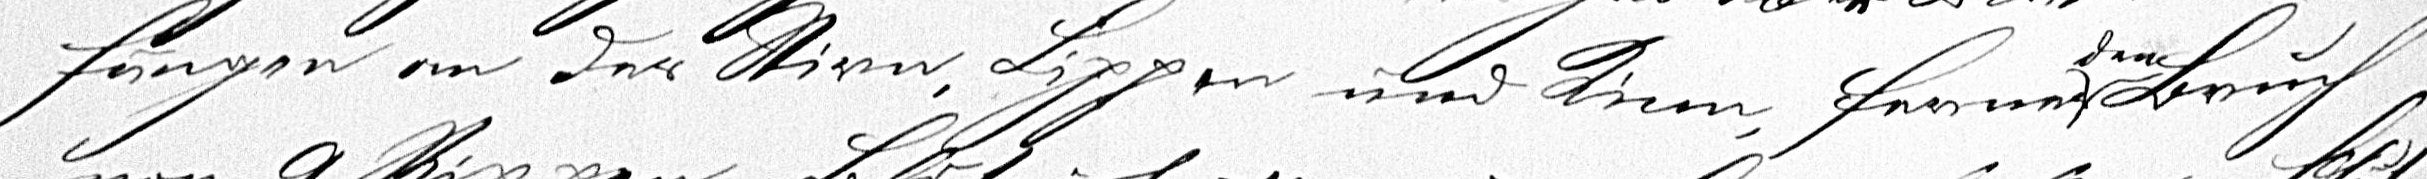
fungen an der Stirn, Lippen und Kinn, ferne Bruch
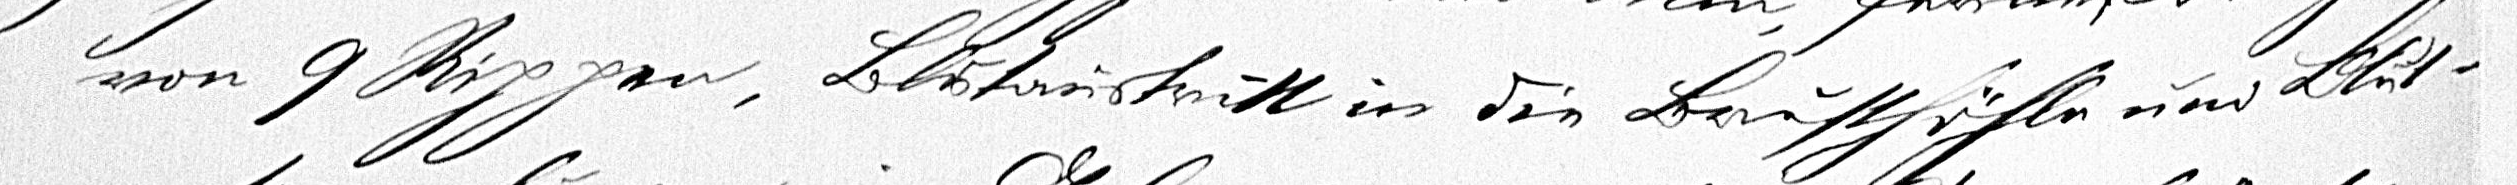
von 9 Rippen, Blutaustritt in die Brusthöhle und Blut¬
